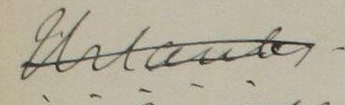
Urlaubs-
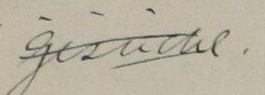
gesuche.
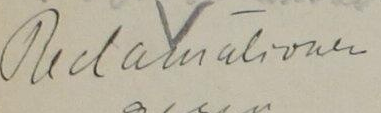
Reclamationen
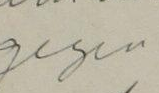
gegen
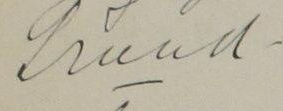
Grund-
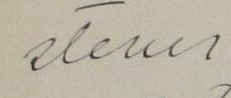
steuer
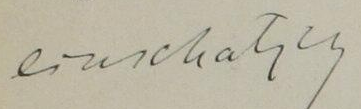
einschätzung
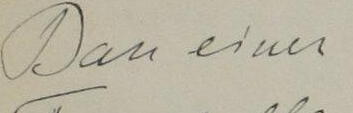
Bau einer
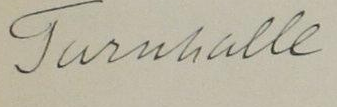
Turnhalle
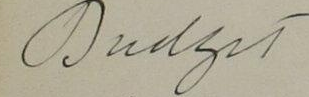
Budget
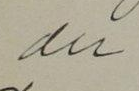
der
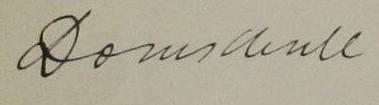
Domschule
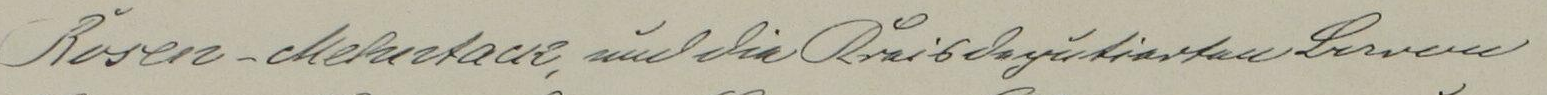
Rosen-Mehntack, und den Kreisdeputierten Baron
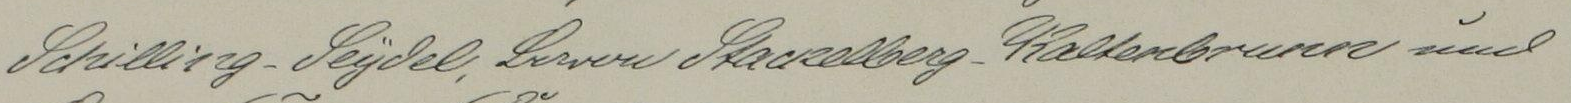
Schilling-Seydel, Baron Stackelberg-Kaltenbrunn und
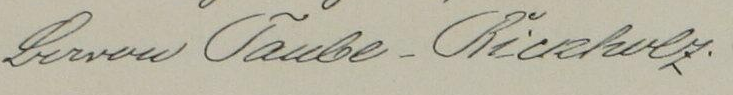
Baron Taube-Rickholz.
